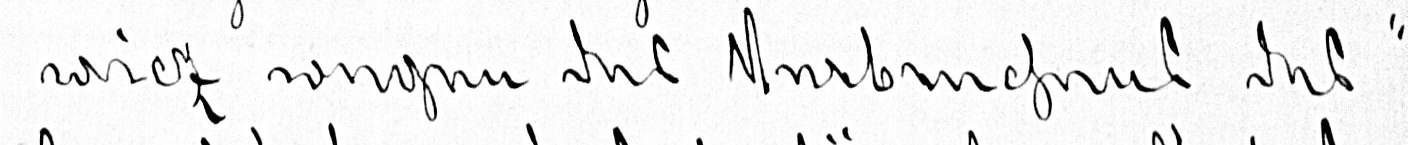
wicz wegen des Verrechens des
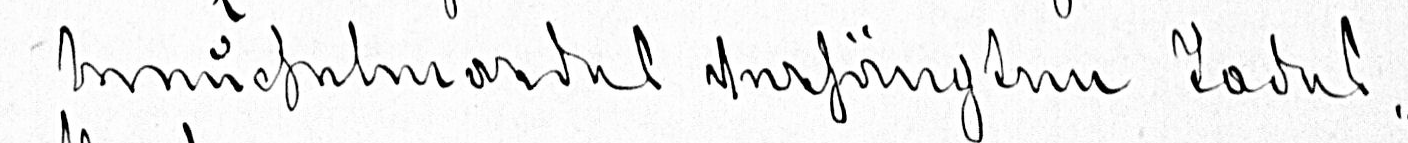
Meuchelmordes verhängten Todes¬
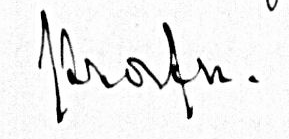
strafe.
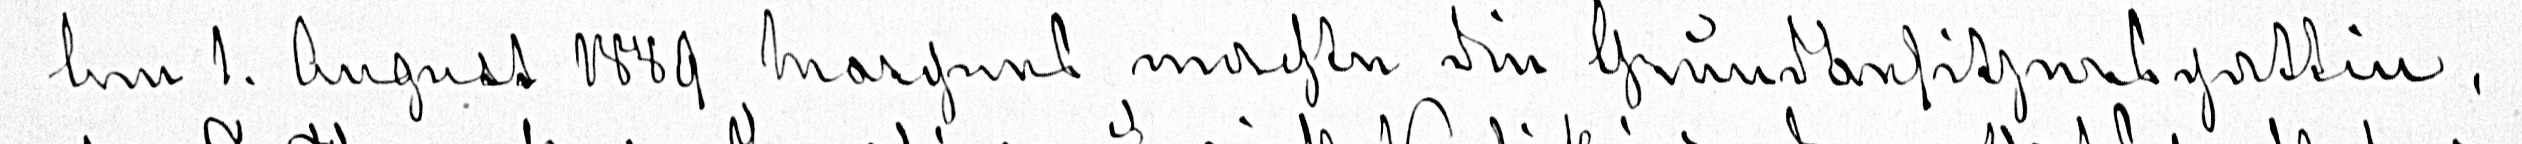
Am 1. August 1889 Morgens machte die Grundbesitzersgattin,
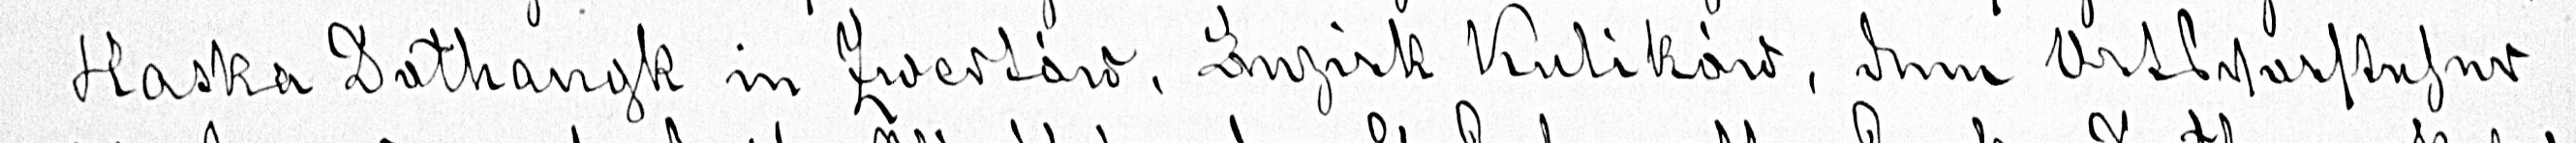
Haska Dothanyk in Zwertów, Bezirk Kulików, dem Ortsvorsteher
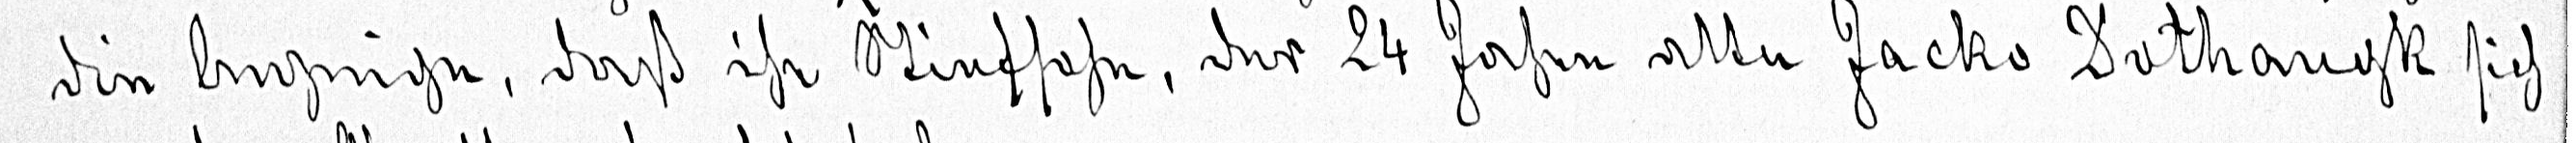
die beginge, daß ihr Stiefsohn, der 24 Jahre alte Jacko Dothanyk sich
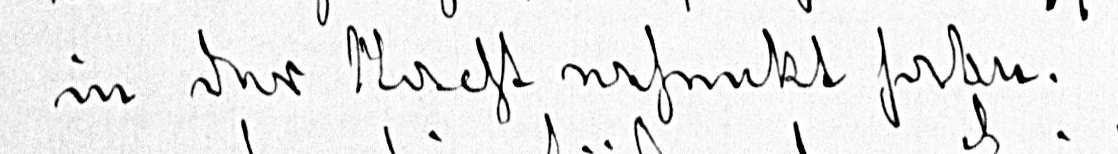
in der Nacht ersenkt habe.
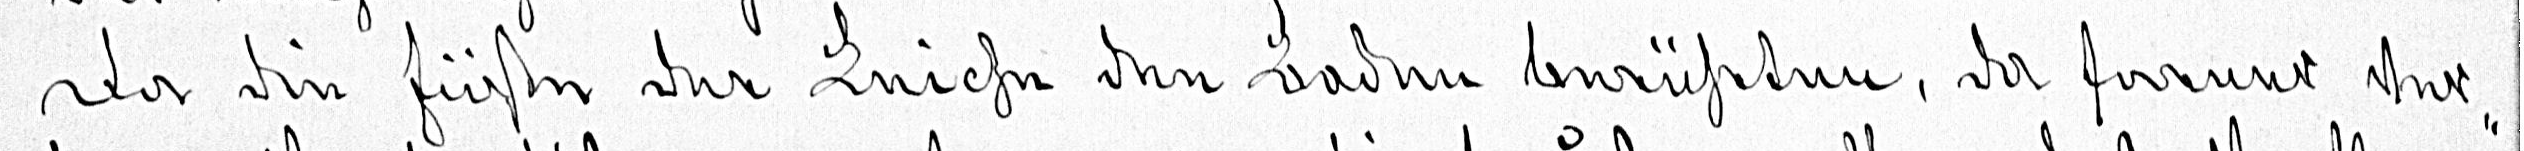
Da die Füße der Leiche den Boden berührten, da ferner ver¬
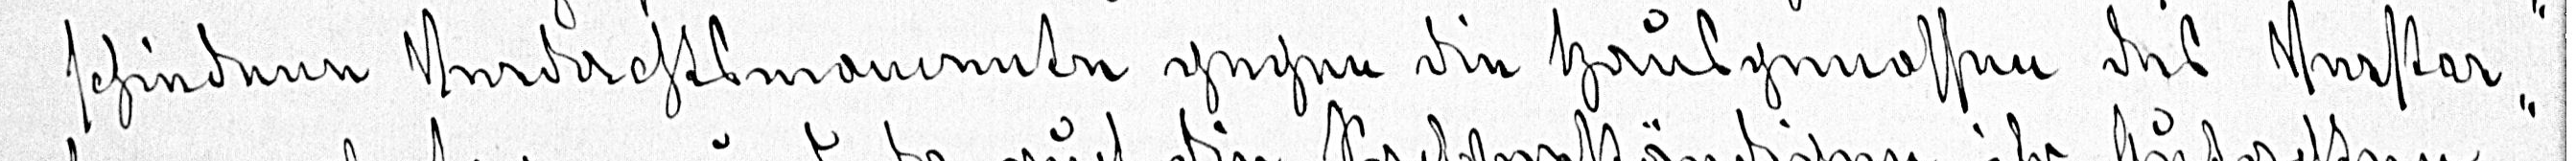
schiedene Verdachtsmomente gegen die Hausgenossen des Verstor¬
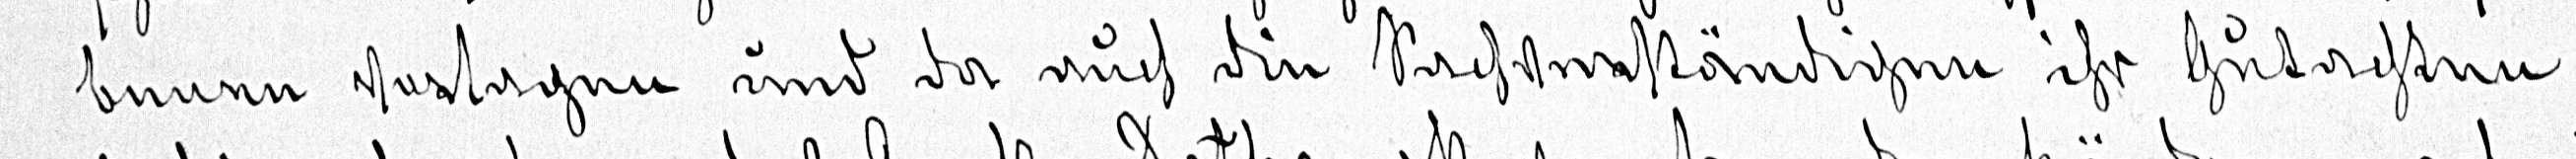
benen vertagen und da auch die Sachverständigen ihr Gutachten
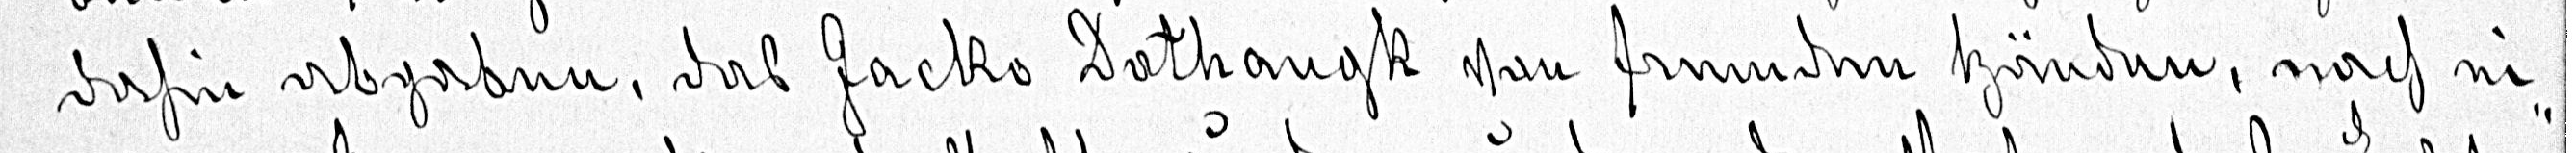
dahin abgaben, das Jacko Dothanyk von fremden Händen, nach ei¬
